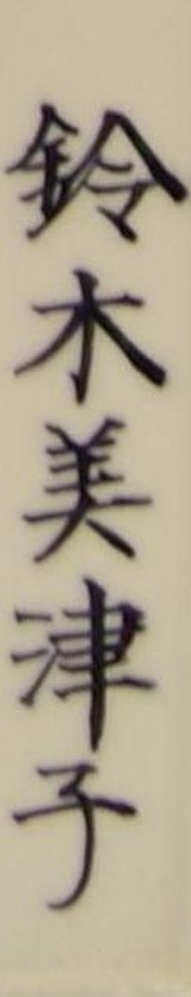鈴木美津子
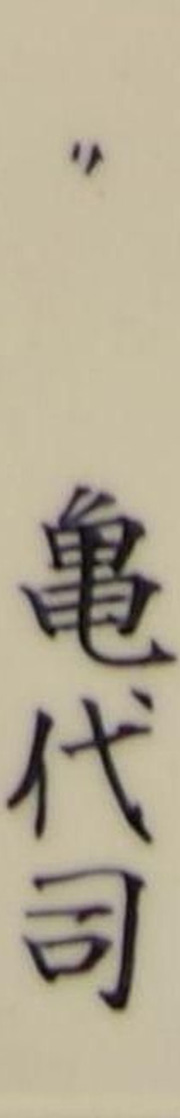亀代司
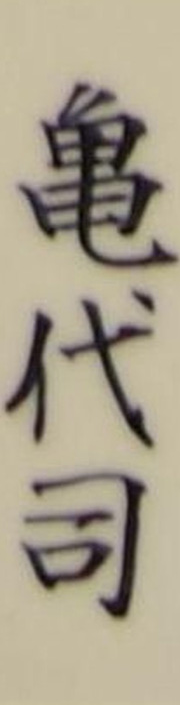亀代司
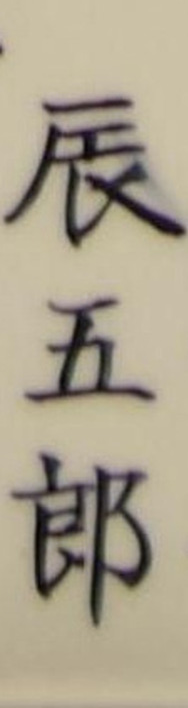辰五郎
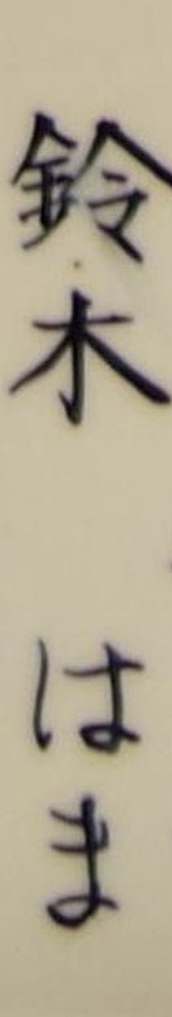鈴木はま
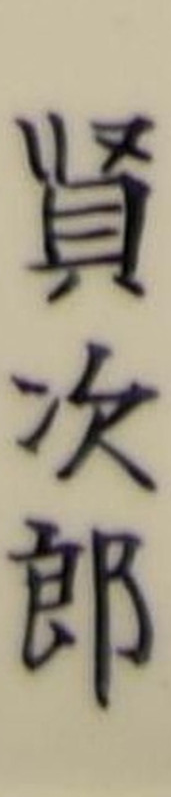賢次郎
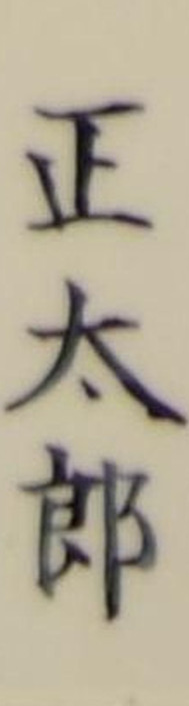正太郎
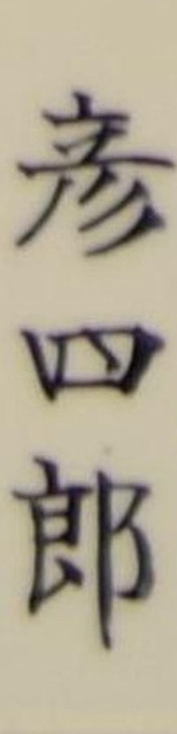彦四郎

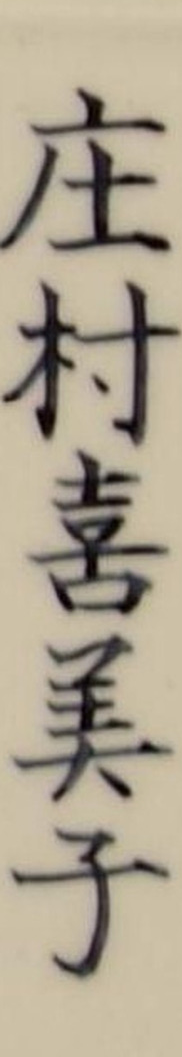庄村喜美子
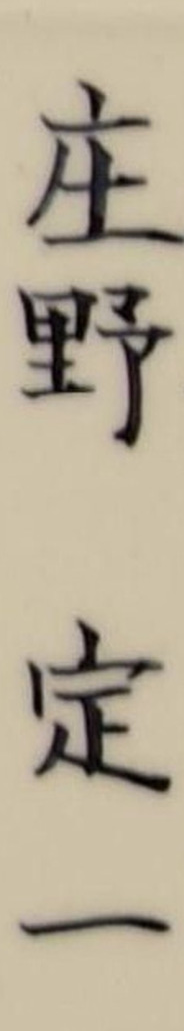庄野定一
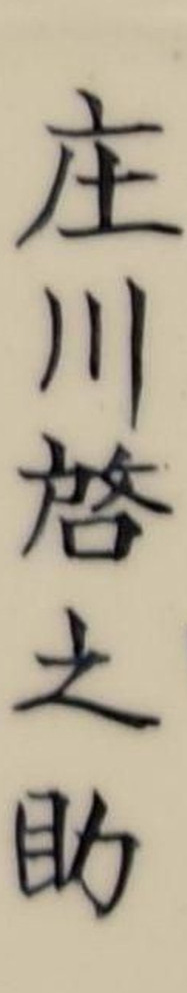庄川啓之助
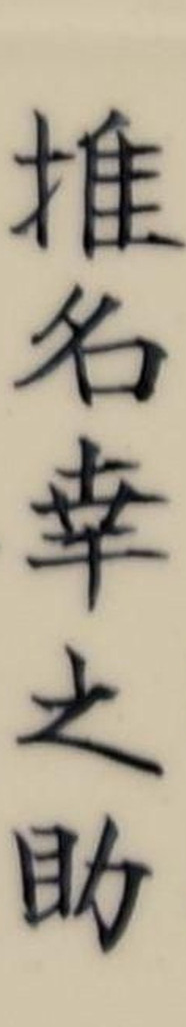推名幸之助
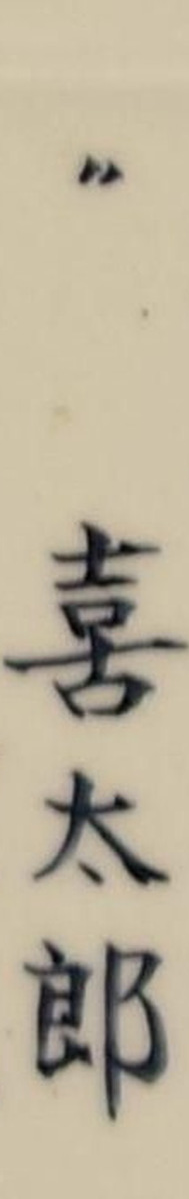喜太郎
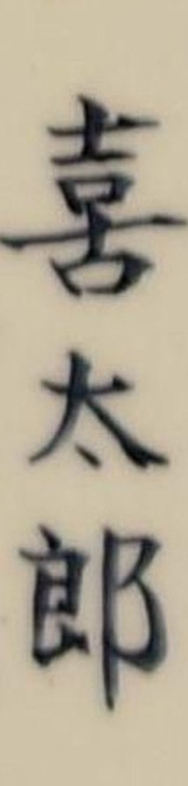喜太郎
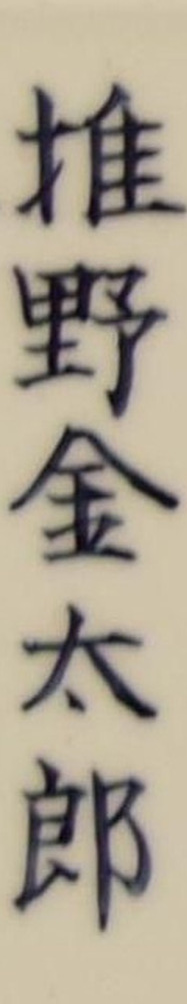椎野金太郎
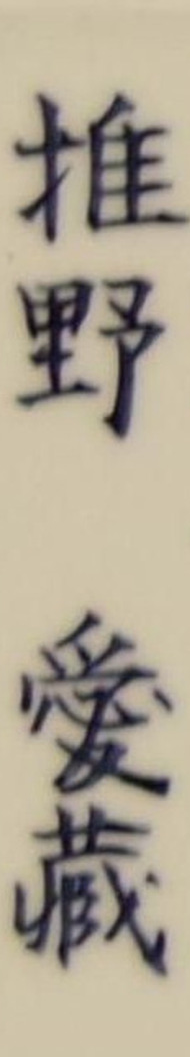椎野愛蔵
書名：A~D
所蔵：koyasan kongobuji
